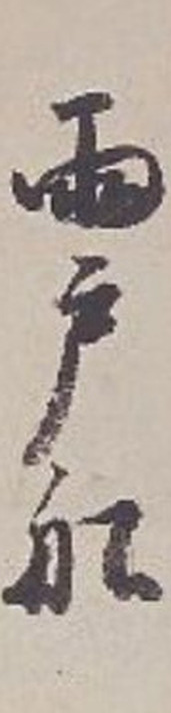雨戸船
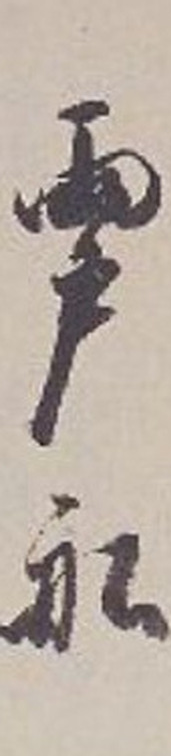雨戸船

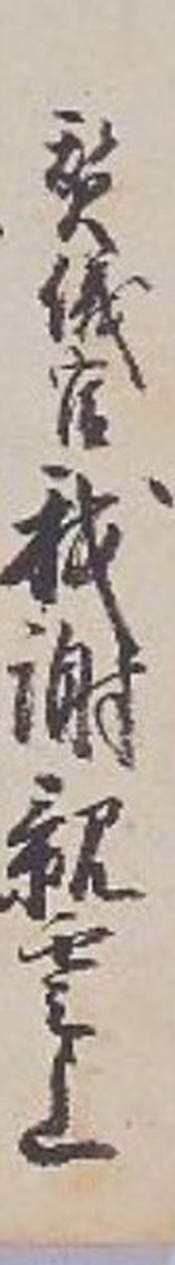賛儀官我謝親雲上
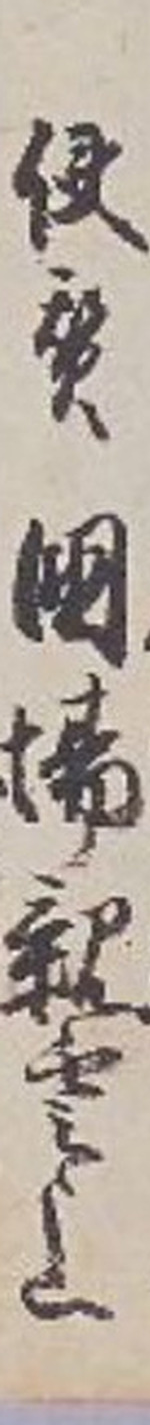使賛国場親雲上
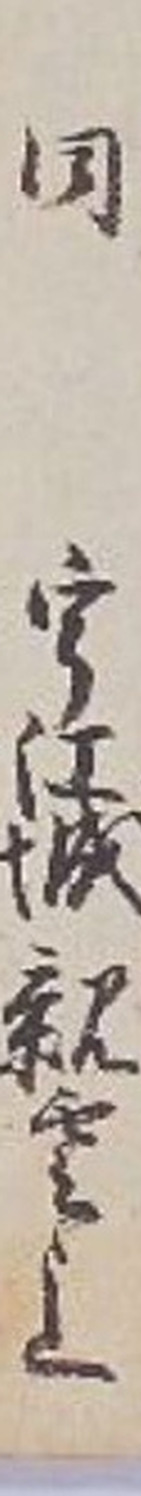同宇江城親雲上
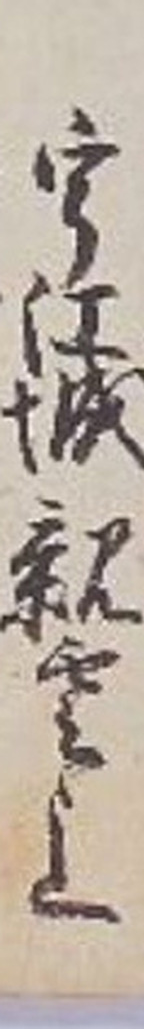同宇江城親雲上
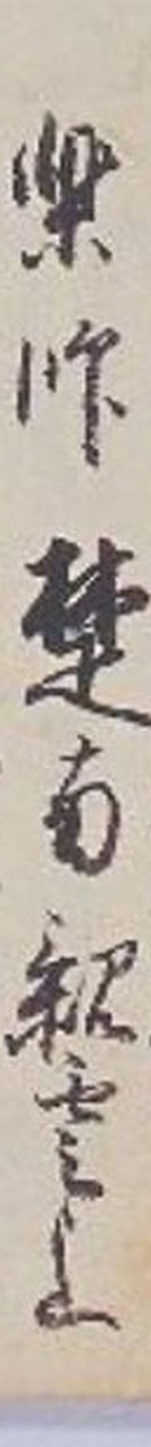楽師楚南親雲上
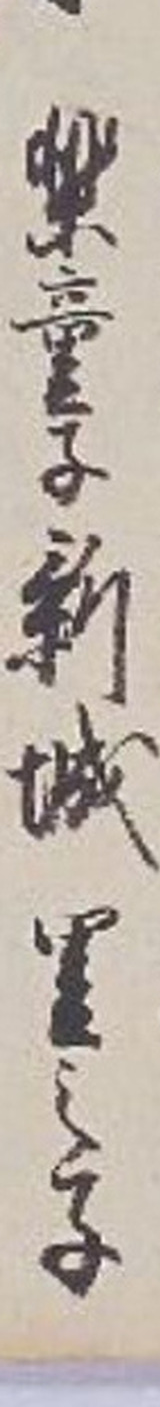楽童子新城里之子
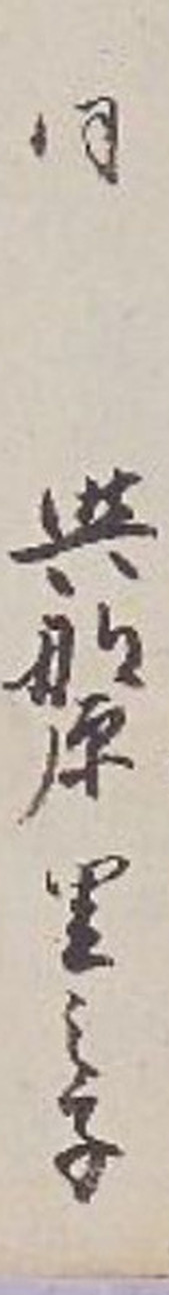同与那原里之子
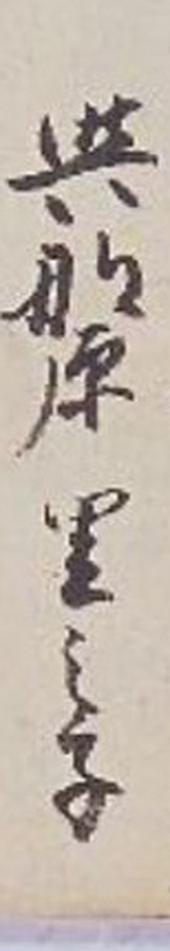同与那原里之子
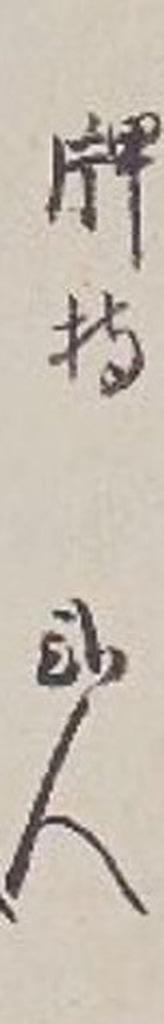牌持弐人
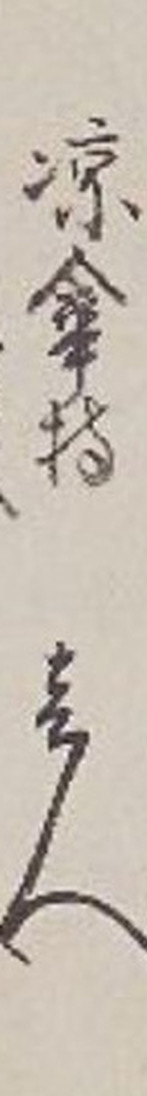凉傘持壱人
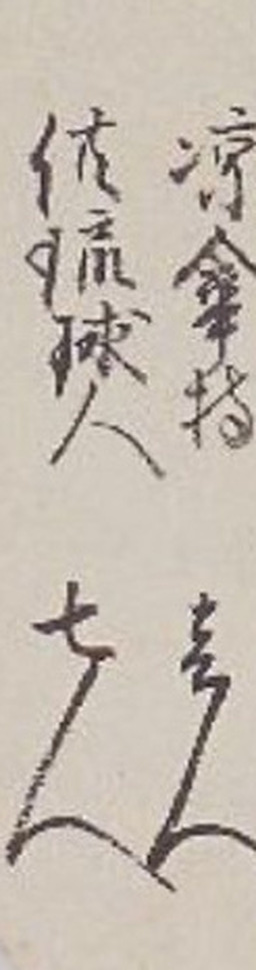供琉球人七人

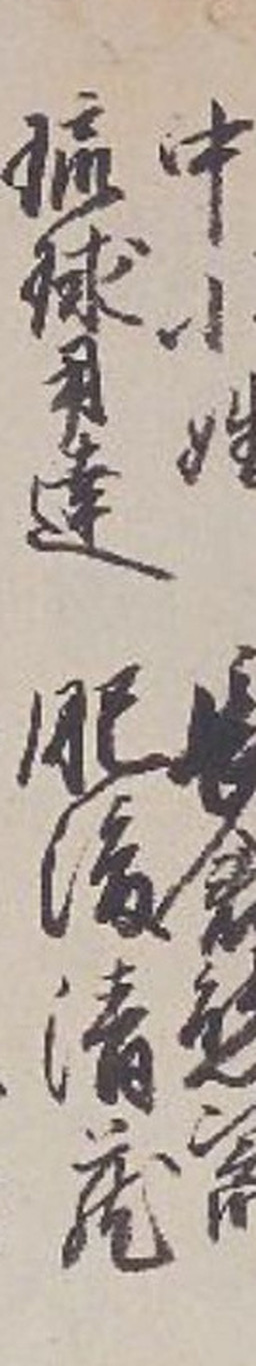琉球用達肥後清蔵
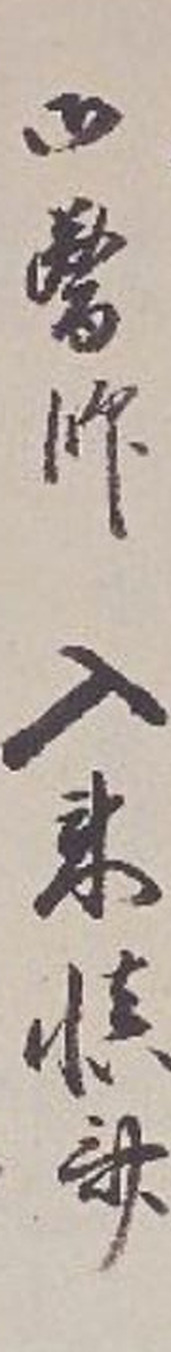御医師入来慎斎
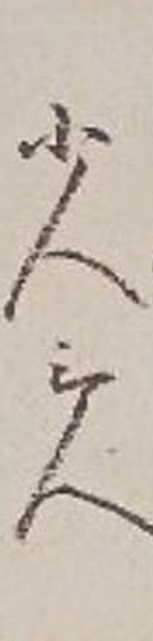小人三人
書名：琉球人就来府淀川筋船行列帳 但木津川より大阪御屋敷迄並其外一巻
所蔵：University of the Ryukyus Library
